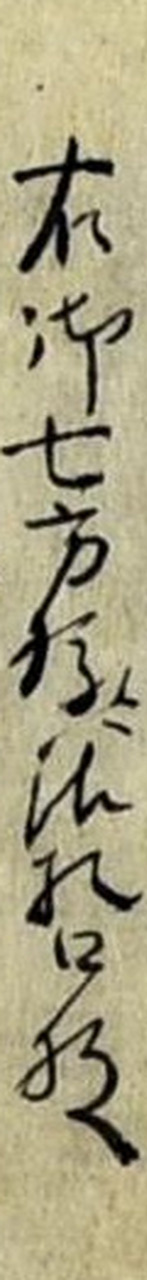右御四方様へ銀八枚
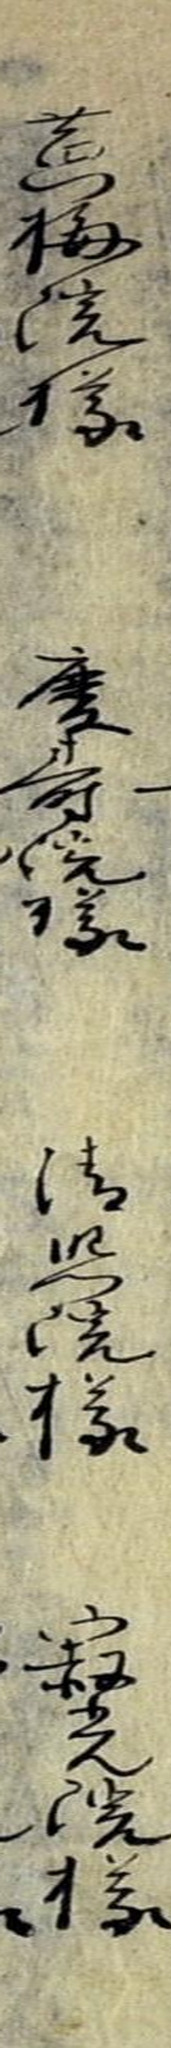黄梅院様慶寿院様清照院様寂光院様
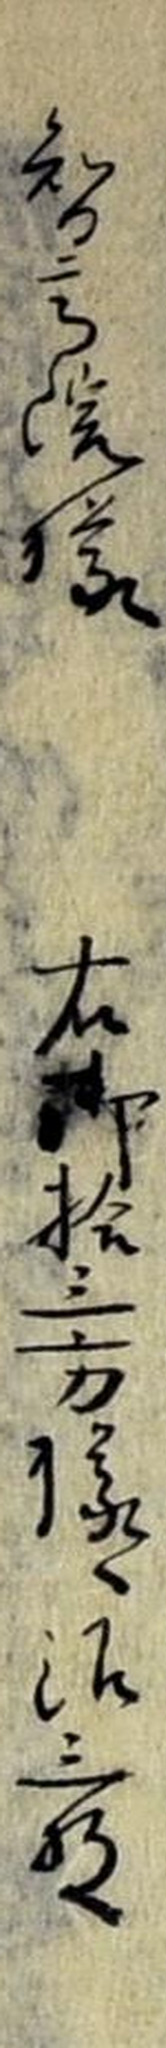智高院様右御拾三方様へ銀三枚
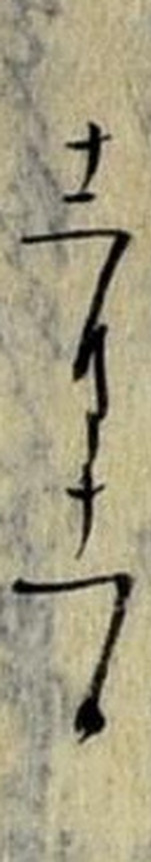十二月十一日

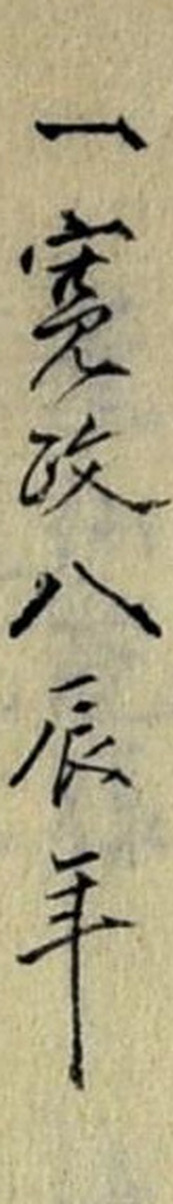一寛政八辰年
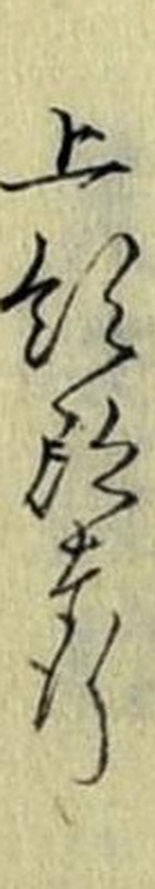上領郡奉行
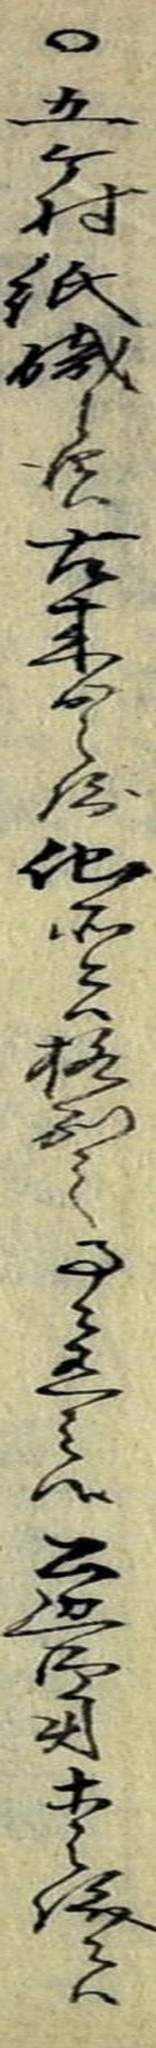〇五ケ村紙職之儀ハ古来ゟ之儀他所とハ格別之事ニ有之候公辺御用等之儀ニハ
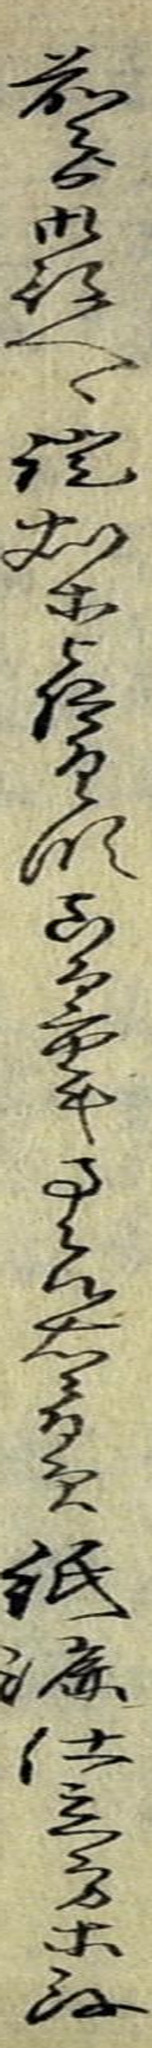前々ゟ御役人へ証判等被仰付候段至而重キ事ニ候右ニ付而ハ紙漉仕立方等致
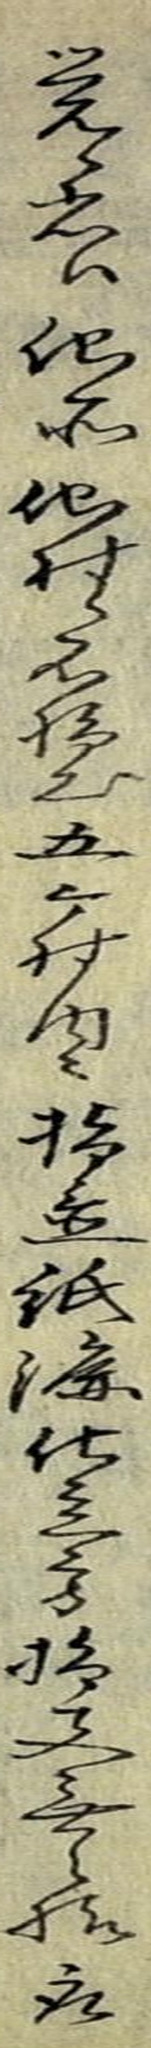覚候者ハ他所他村へ不指出五ケ村内ニ指置紙漉仕立方指支無之様取
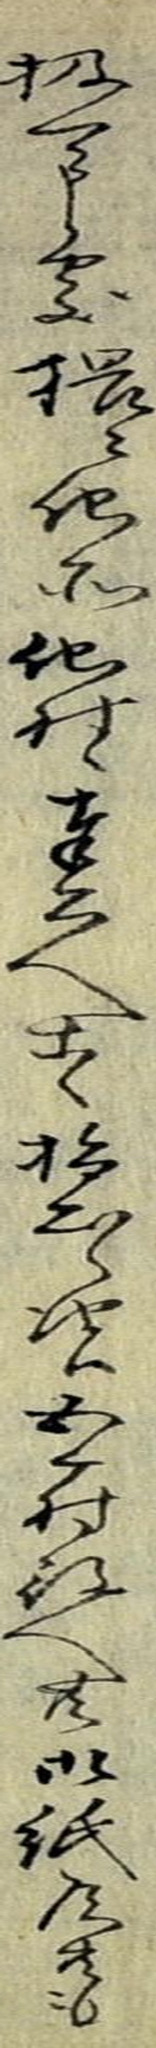扱可申候処猥ニ他所他村へ奉公人等へ指出候儀ハ五ケ村役人共御紙屋共も
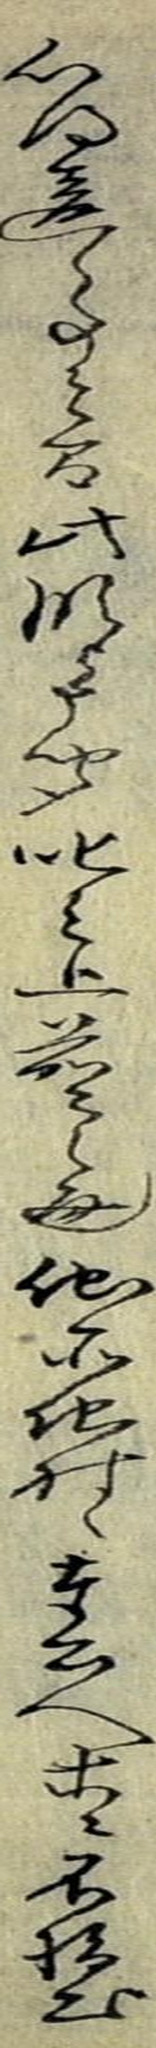心得違之事ニ候間此段被申聞叱之上前々之通他所他村へ奉公人等ニ不指出
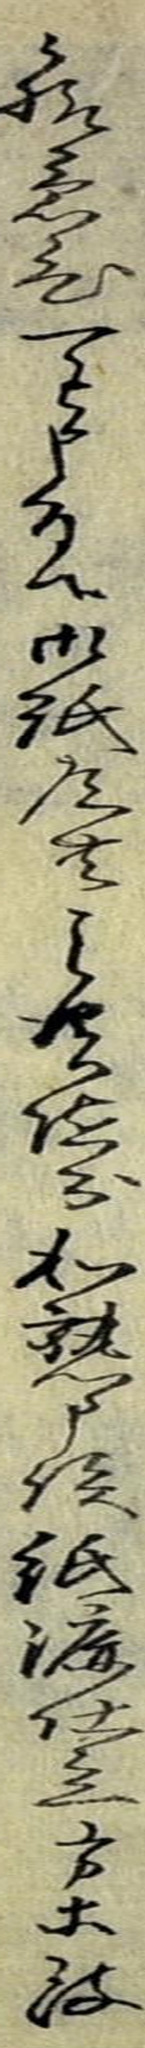候様急度可被申付候御紙屋共之儀ハ随分和熟申談紙漉仕立方等致
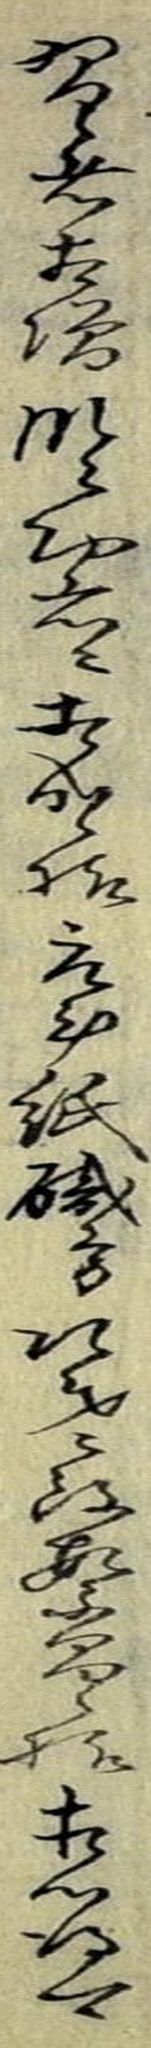習候者相増段々功者ニ相成候様取計紙職方次第ニ致繫昌候様相心得可
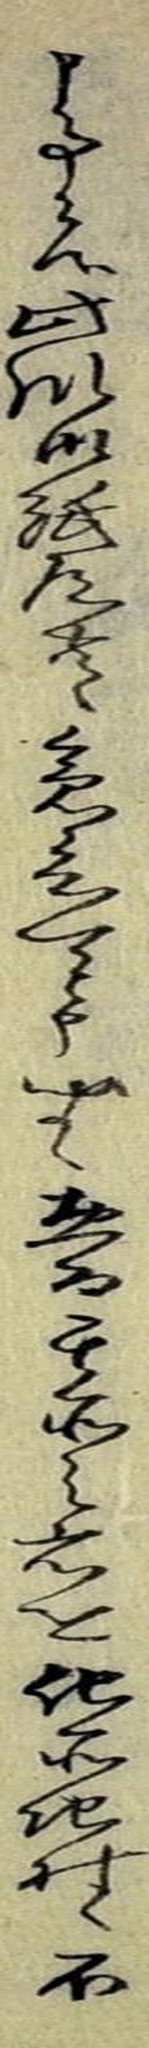申事ニ候此段御紙屋共へ急度可被申聞候惣而其所之者を他所他村へ不
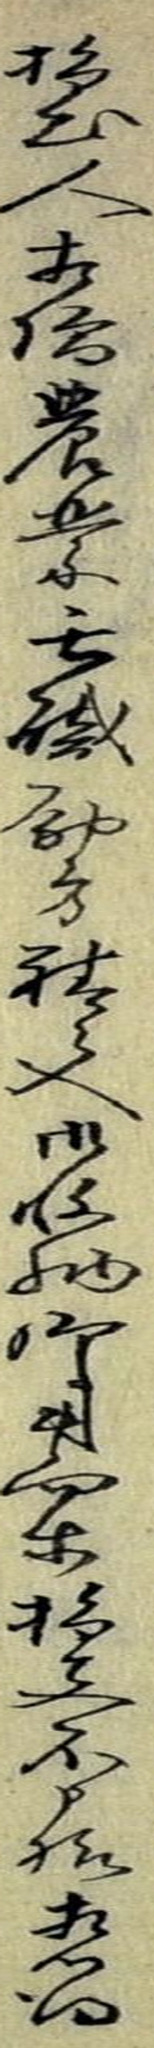指出人相増農業其職励方精ニ入御収納御用向等指支不申様相心得
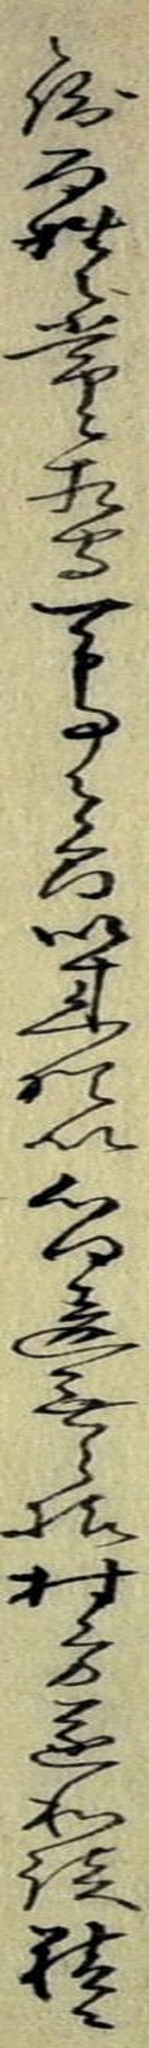候儀百姓之常ニ相守可申事ニ候間以来猶以心得違無之様村方遂和談精ニ
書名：命令之部 三
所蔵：福井県文書館 Fukui Prefectural Archives
